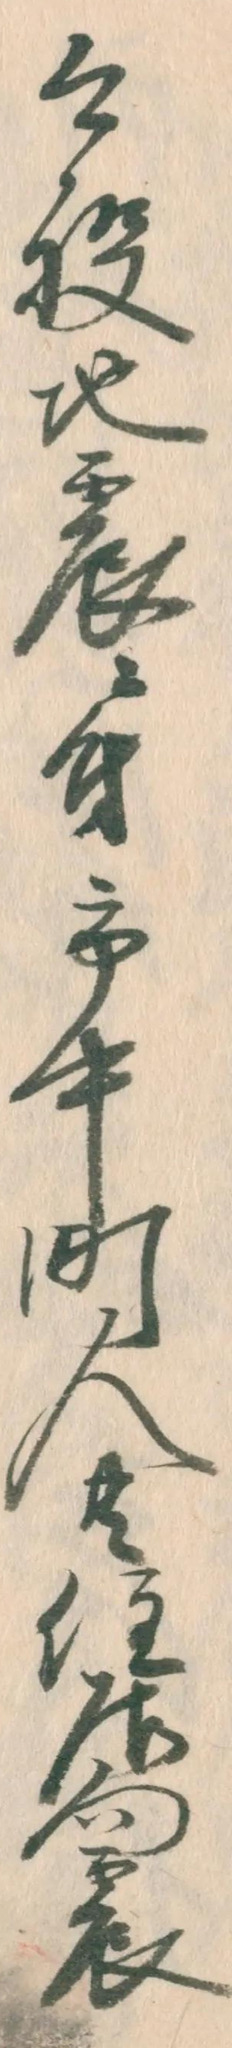今般地震ニ付市中町人共住居向震
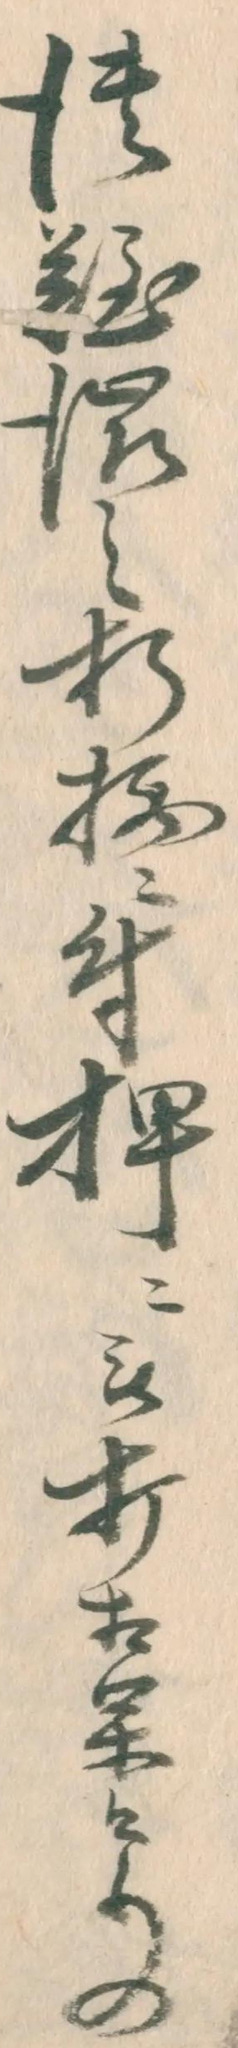潰難渋之折柄ニ付摧ニ被打相果候もの

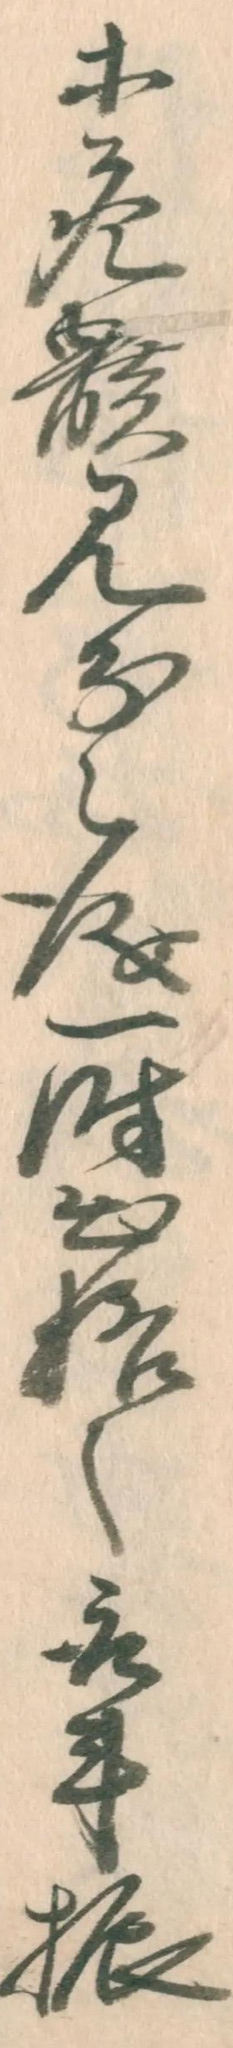等死骸見分之儀一時出格之取計振
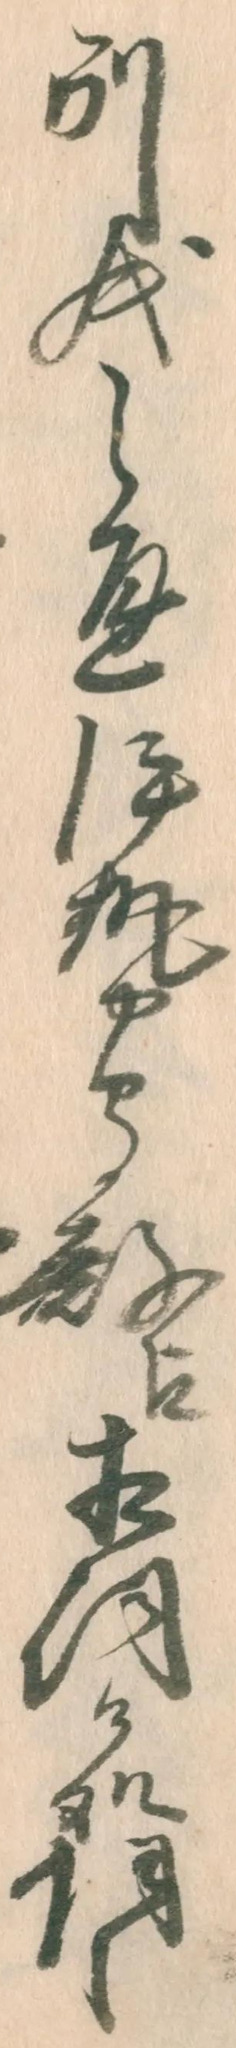別紙之通伊勢守殿江相伺候処伺之
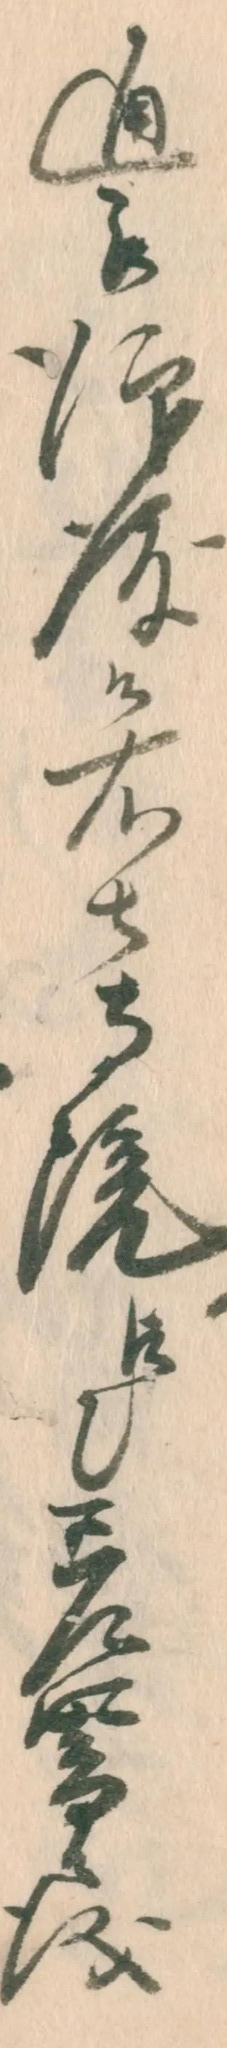通被仰渡候右は寺院江も差響候儀
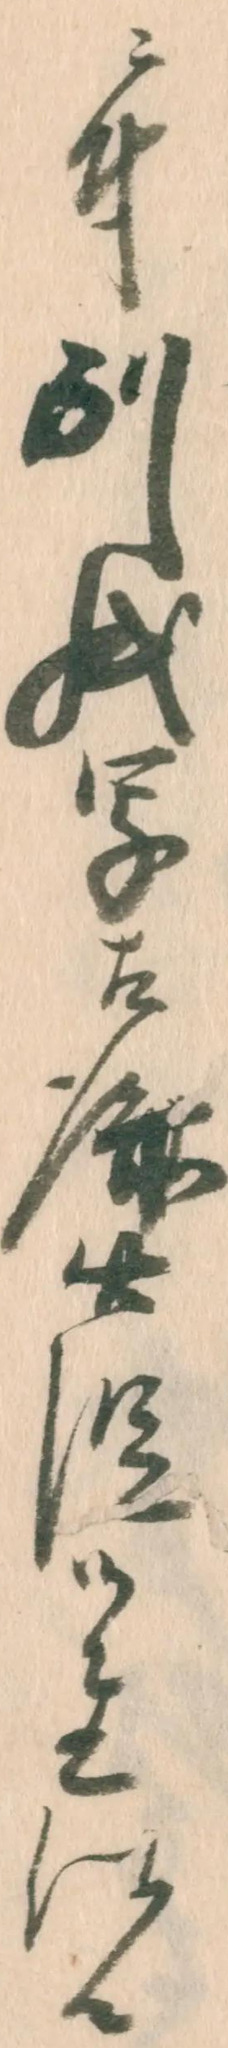ニ付別紙写し相添此段御達仕候
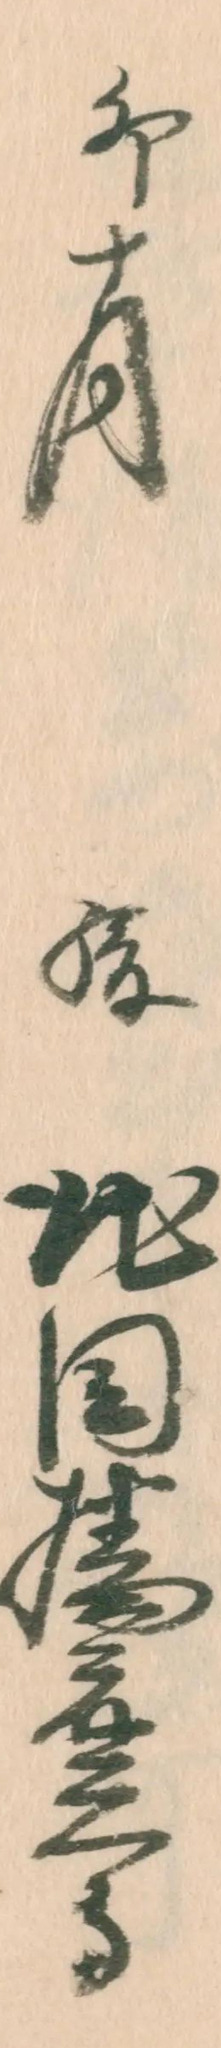卯十月後池田播磨守
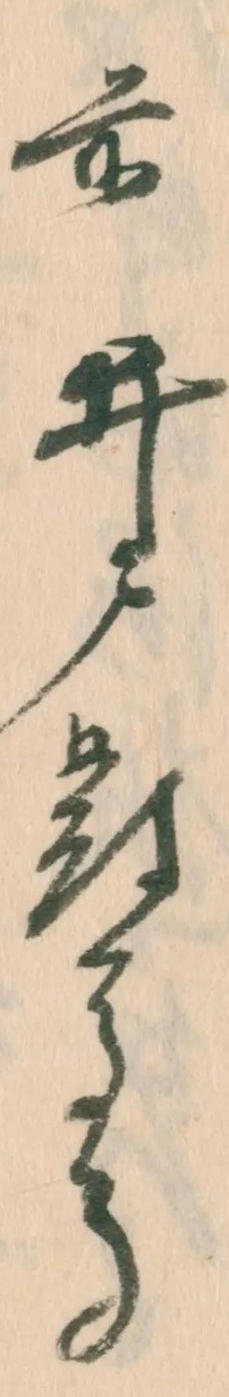前井戸対馬守
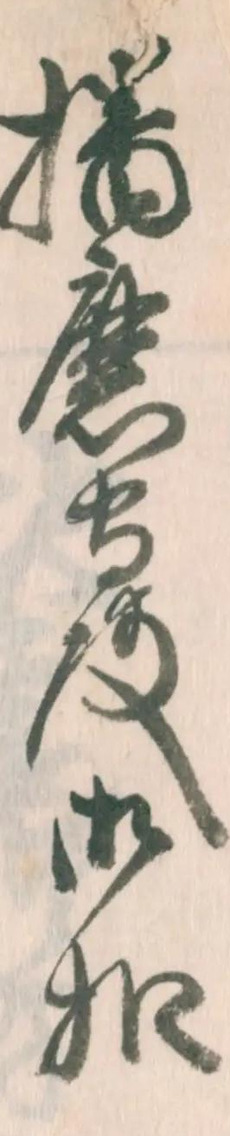「播磨守殿御扣」

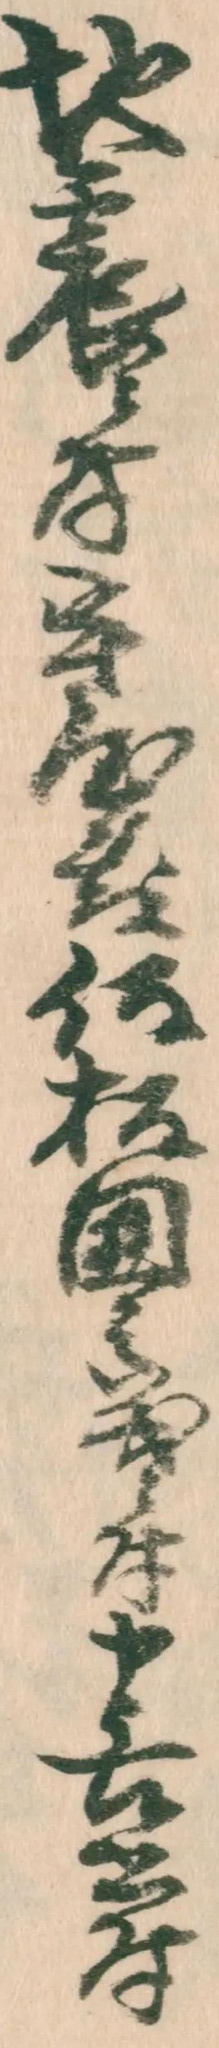│地震ニ付牢屋敷仮板囲之義ニ付申上候書付
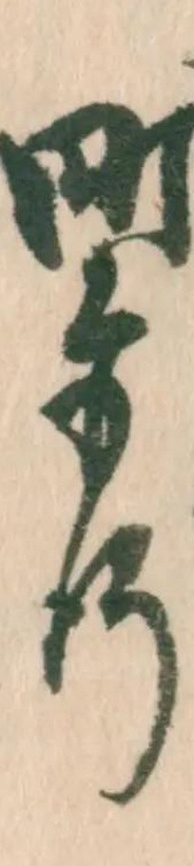│町奉行
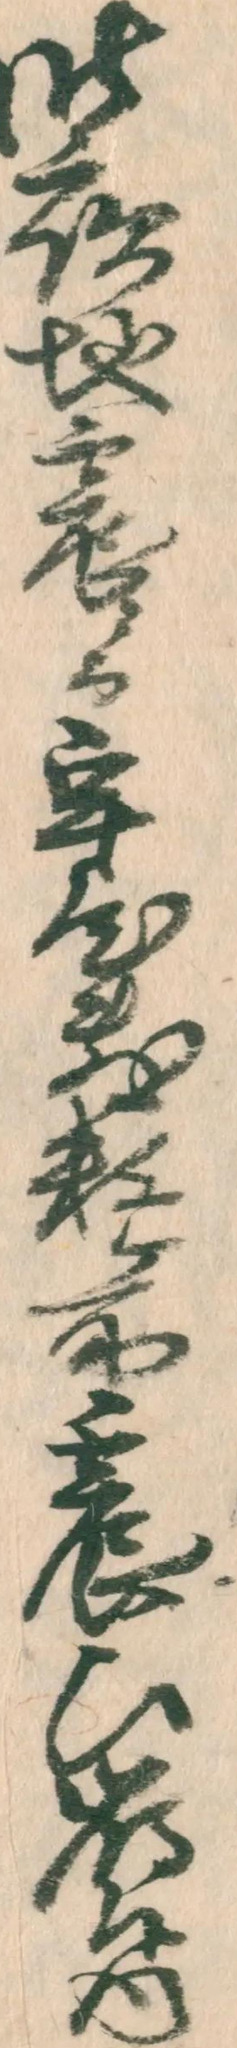昨夜地震ニて牢屋敷数ケ所震ひ崩候内
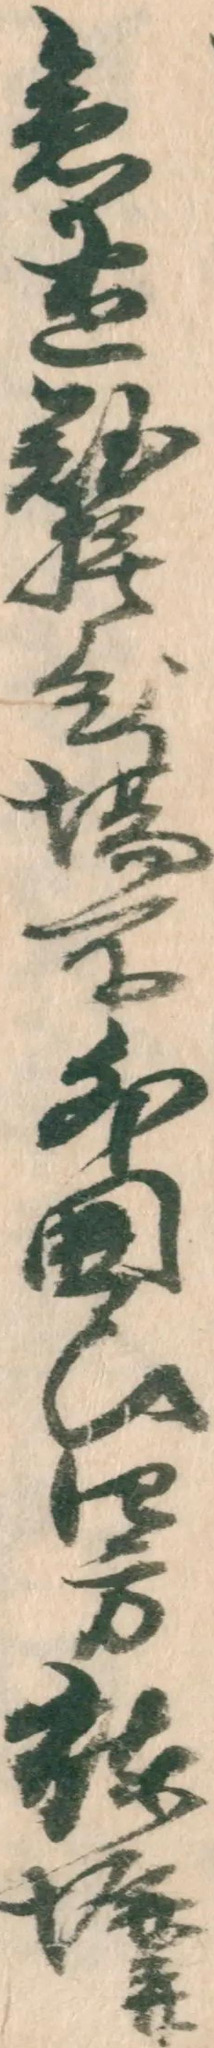急速難捨置場所外囲ひ四方煉塀幷
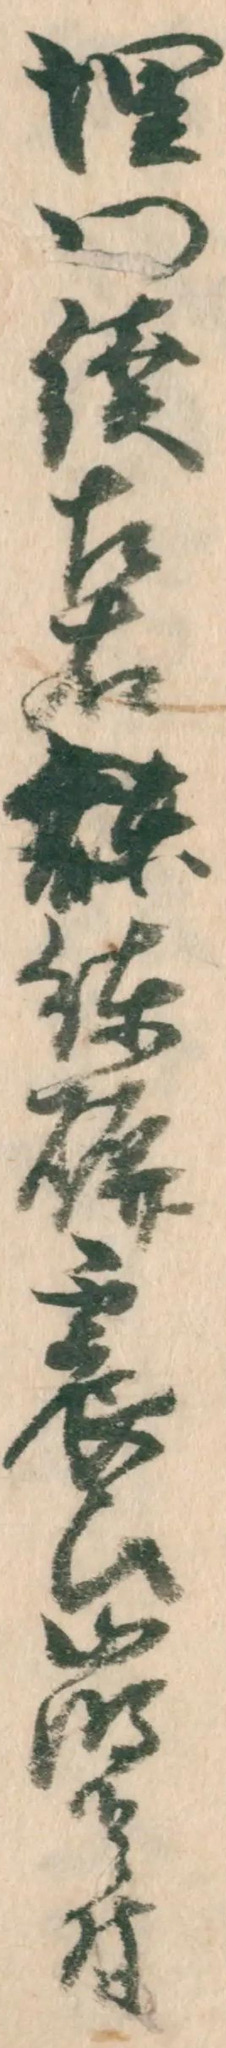埋門続左右煉塀震ひ崩候ニ付

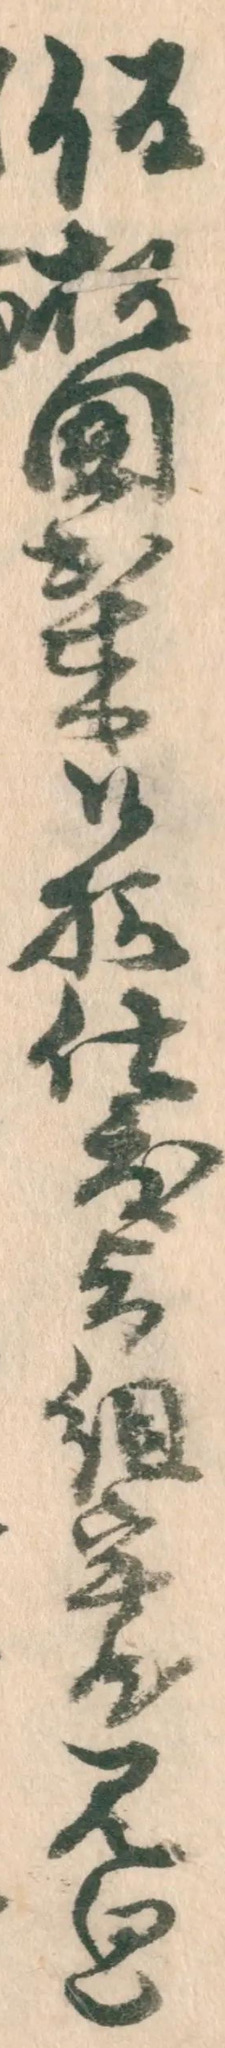仮板囲出来候様仕度旨組牢屋見廻
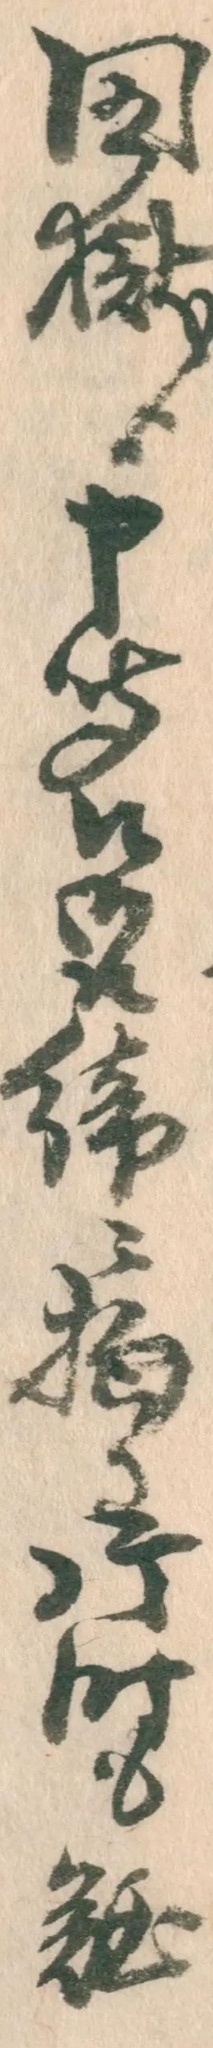囚獄ゟ申聞候御取締ニ拘り片時も難
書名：地震災書留 2巻. [2] 内表紙に「地震一件　安政二卯年十月」とあり
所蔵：国立国会図書館 National Diet Library, JAPAN
